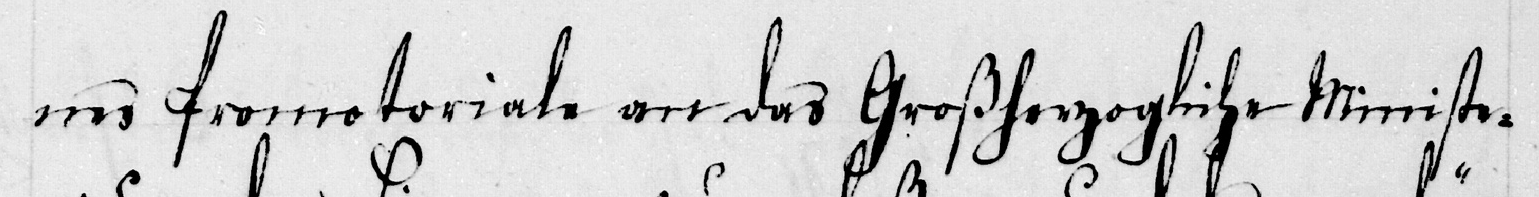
nes Promotoriale an das Großherzogliche Ministe¬
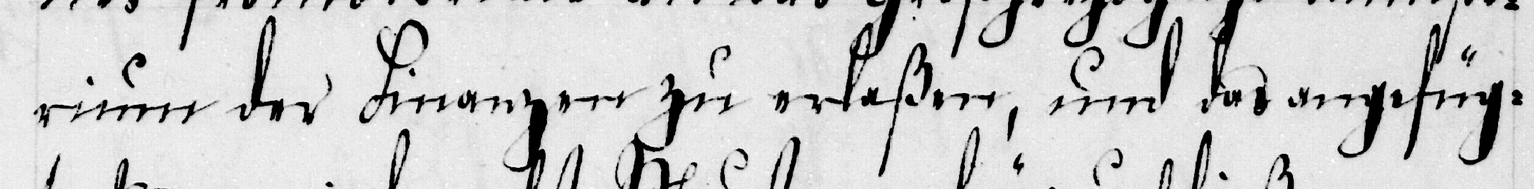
rium der Finanzen zu erlaßen, und das angefüg¬
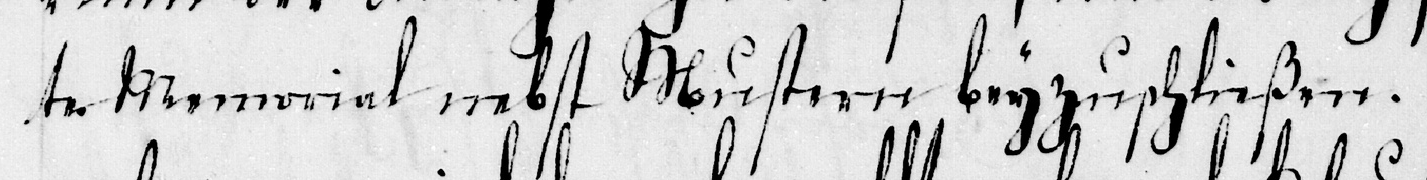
te Memorial nebst Mustern beyzuschließen.
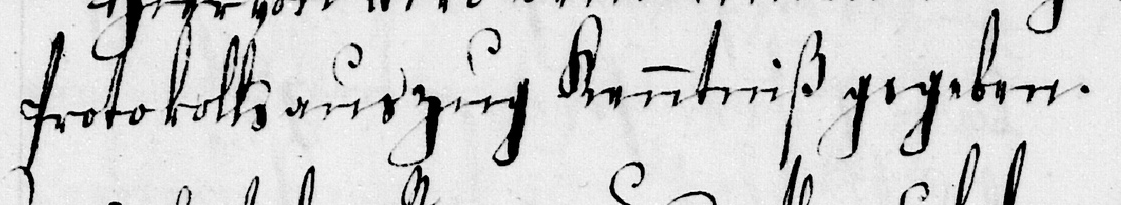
Protokollsauszug Kenntniß gegeben.
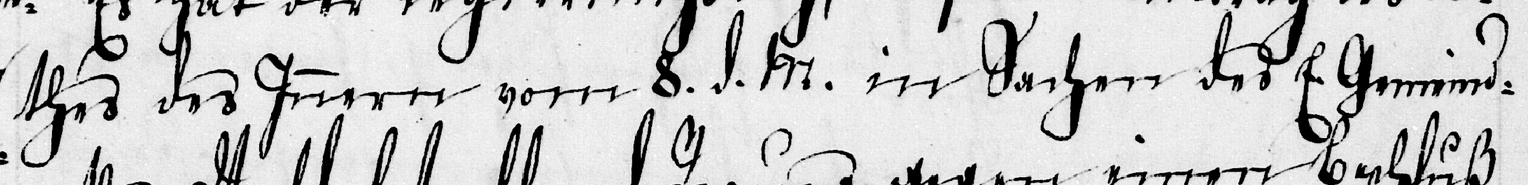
thes des Innern vom 8. d. M. in Sachen des E. Gemeind¬
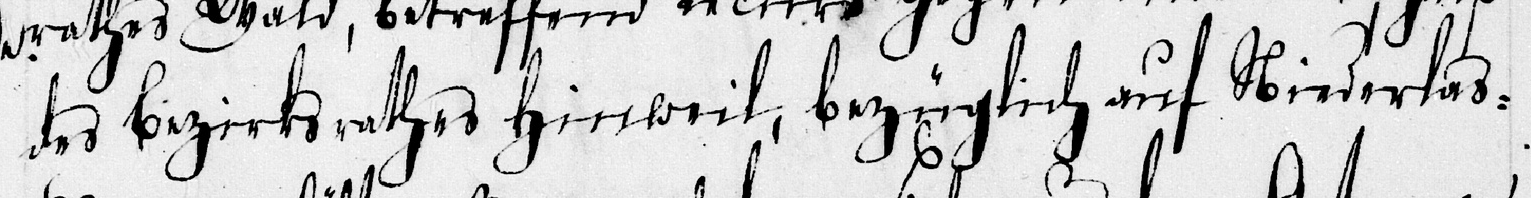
des Bezirksrathes Hinweil, bezüglich auf Niederla¬
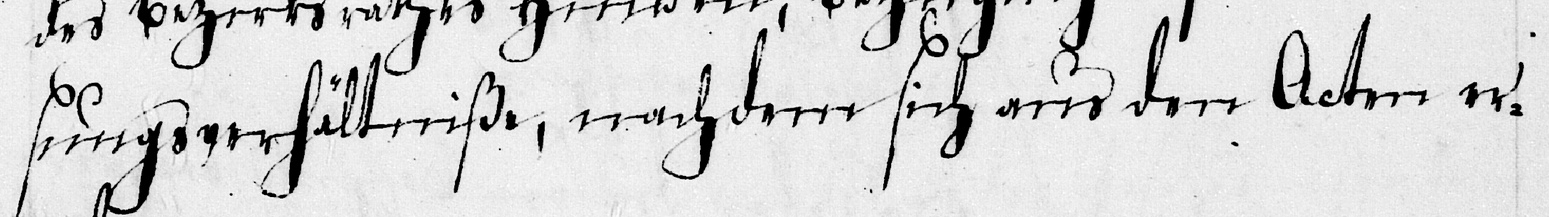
ßungsverhältniße, nachdem sich aus den Acten er¬
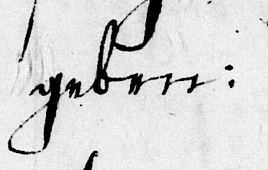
geben:
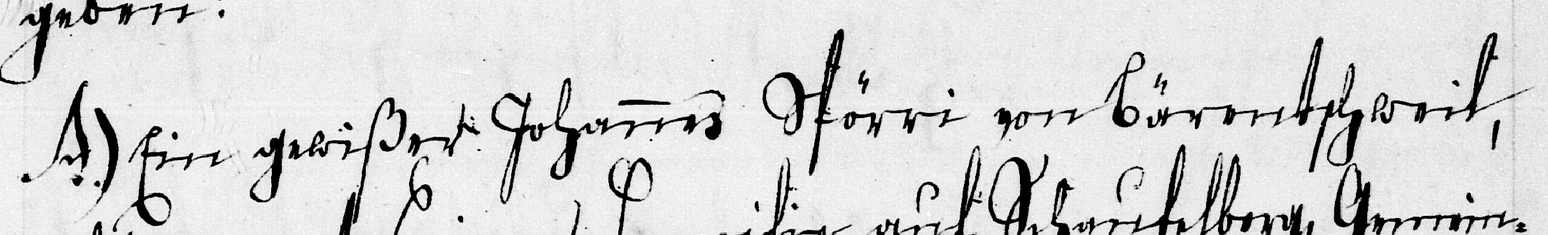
A.) Ein gewißer Johannes Spörri von Bärentschweil,
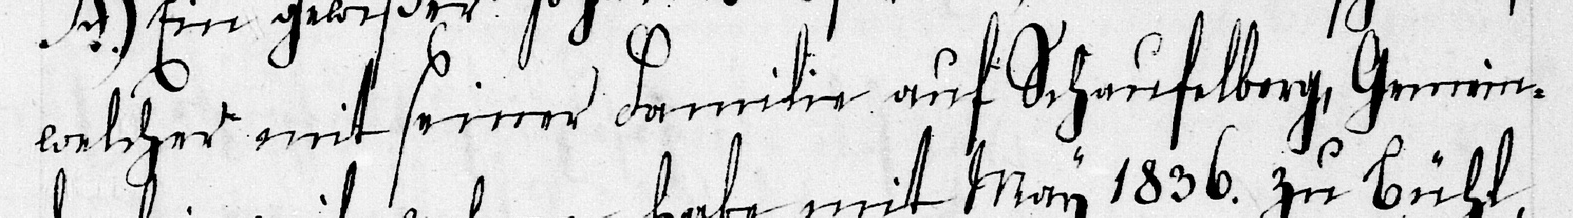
welcher mit seiner Familie auf Schaufelberg, Gemein¬
